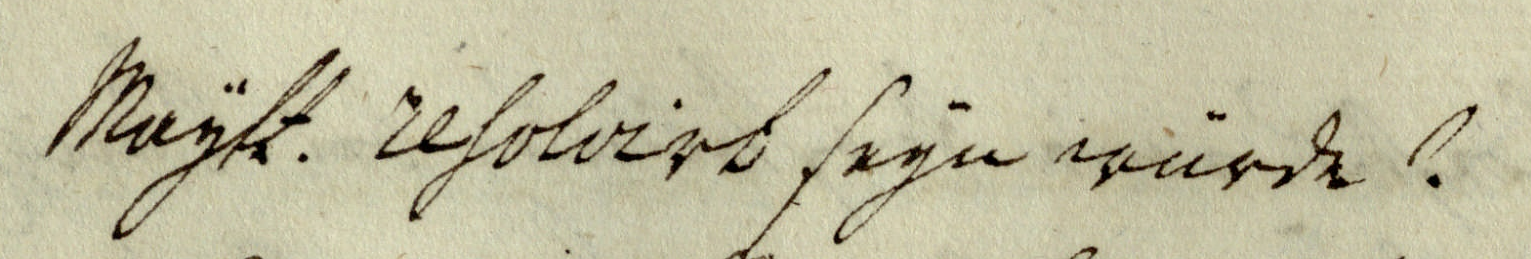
Maÿst. resolvirt seÿn würde?
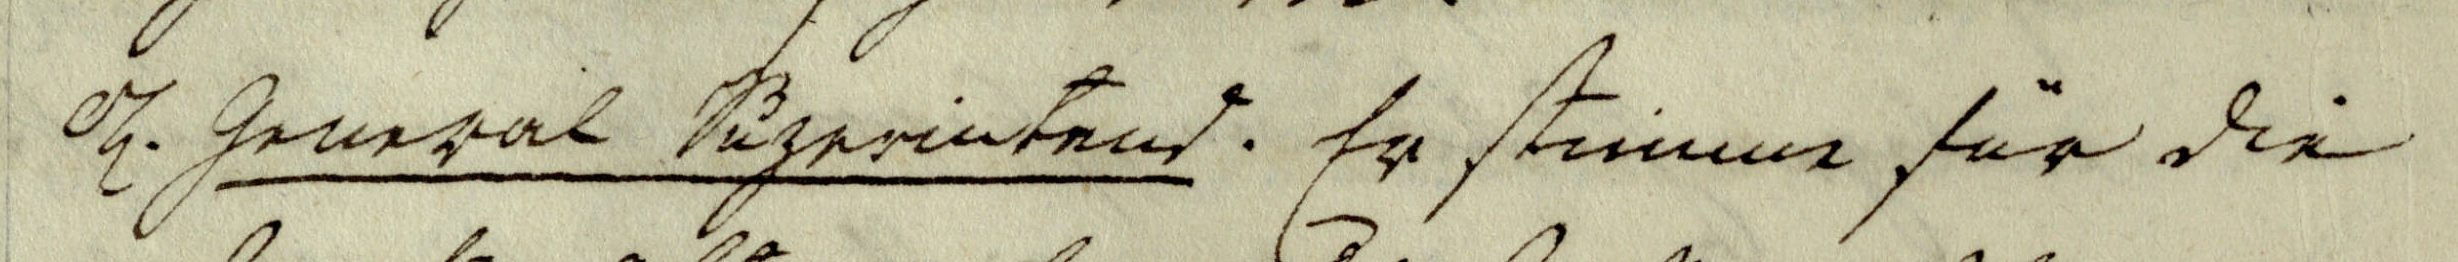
dh. General Superintend. Er stimme für die
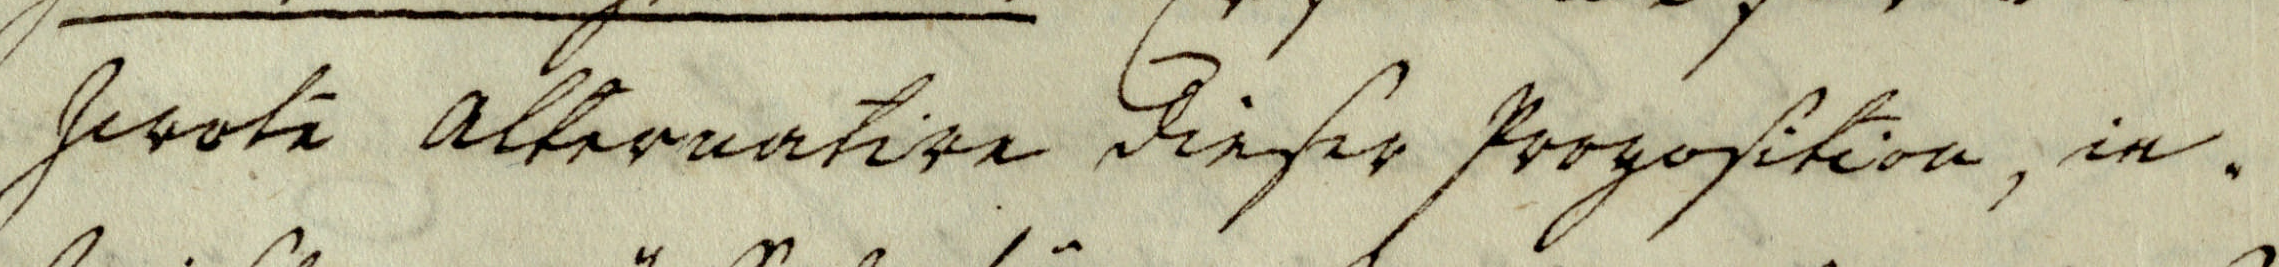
zwote Aternative dieser Proposition, in¬
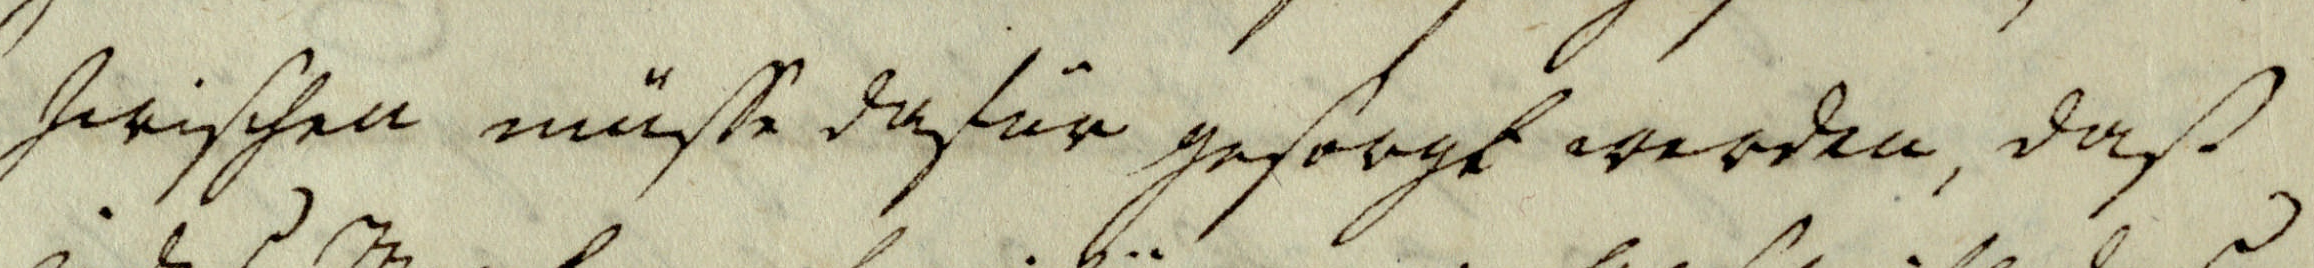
zwischen müsse dafür gesorgt werden, daß
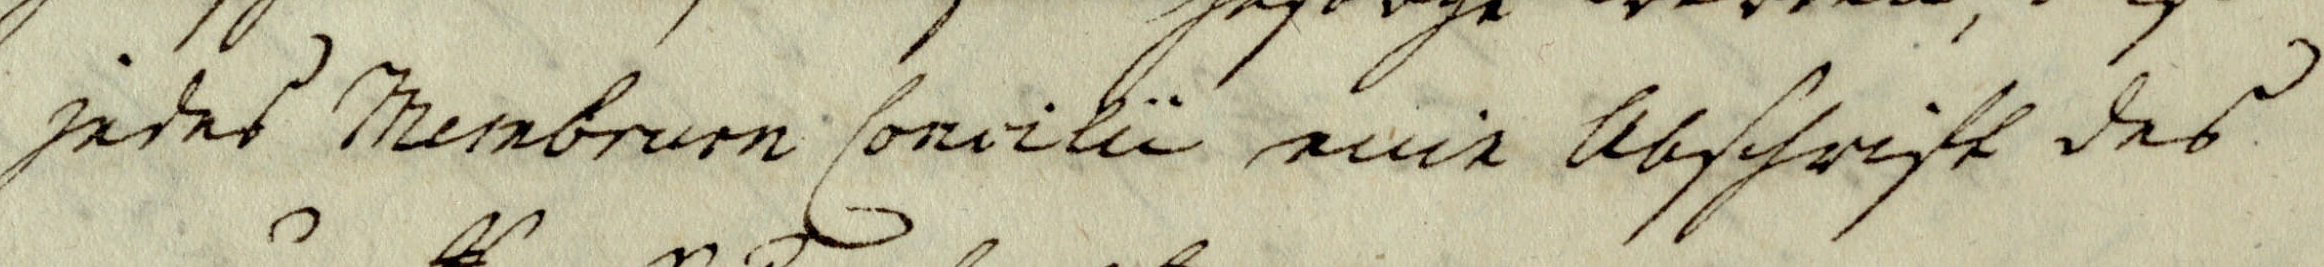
jedes Membrum Concilii eine Abschrift des
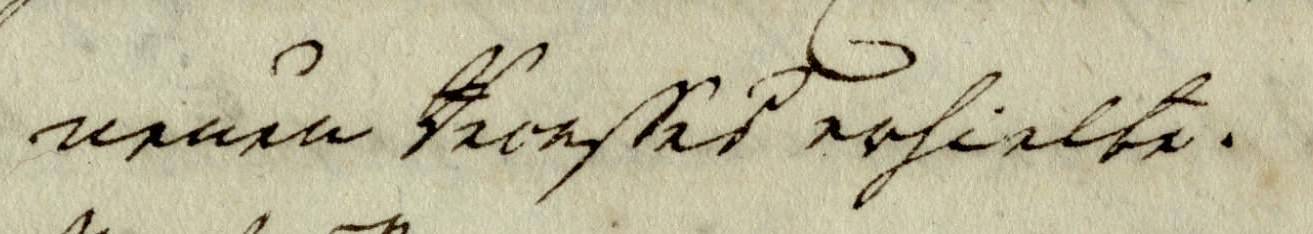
neuen Recesses erhielte.
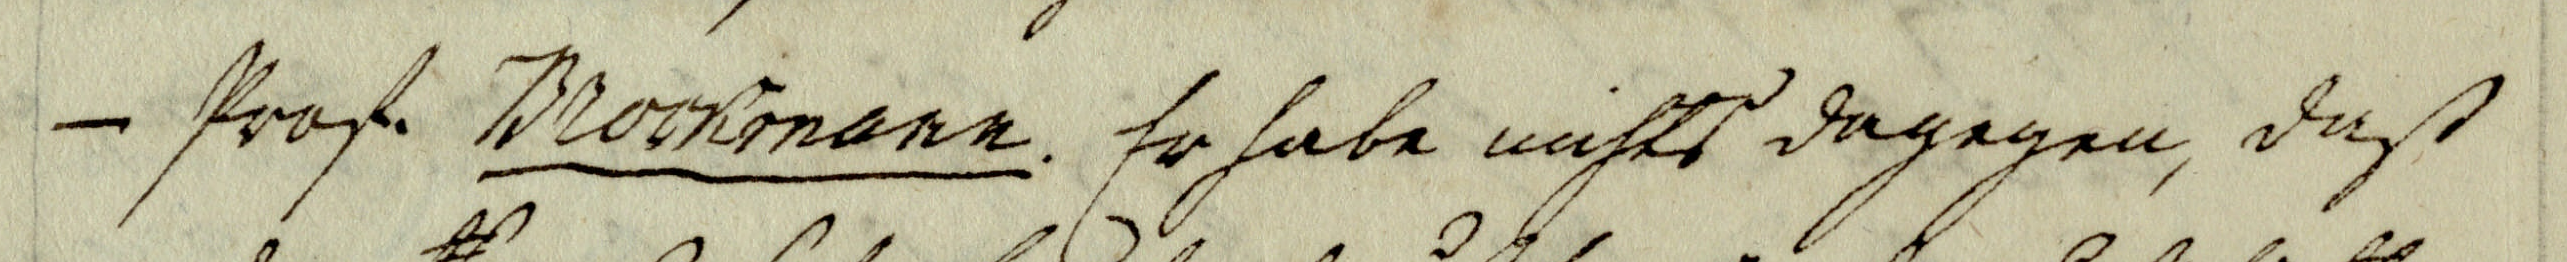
Prof. Brockmann. Er habe nichts dagegen, daß
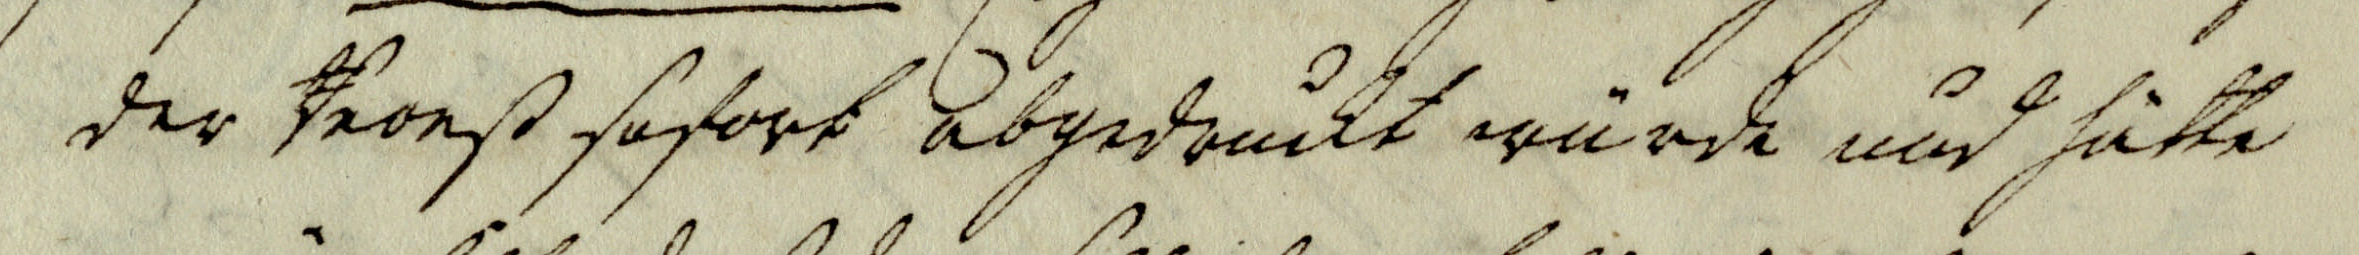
der Receß sofort abgedruckt würde und hätte
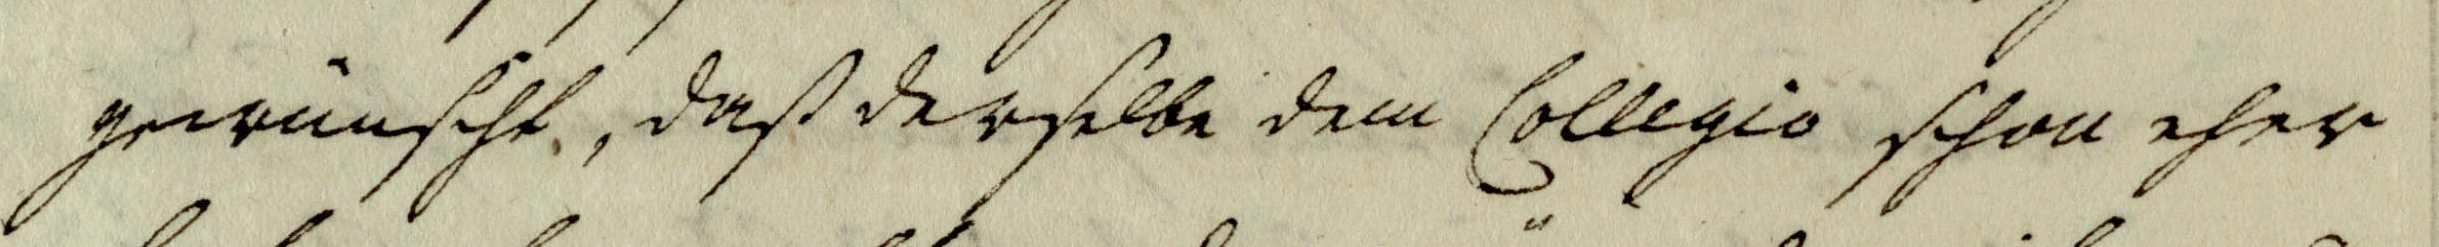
gewünscht, daß derselbe dem Collegio schon eher
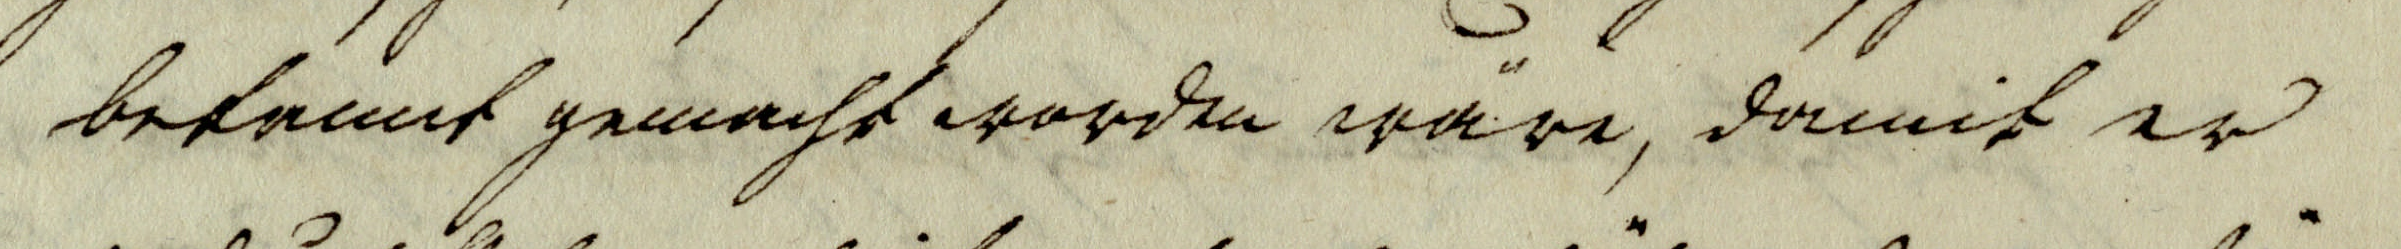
bekannt gemacht worden wäre, damit er
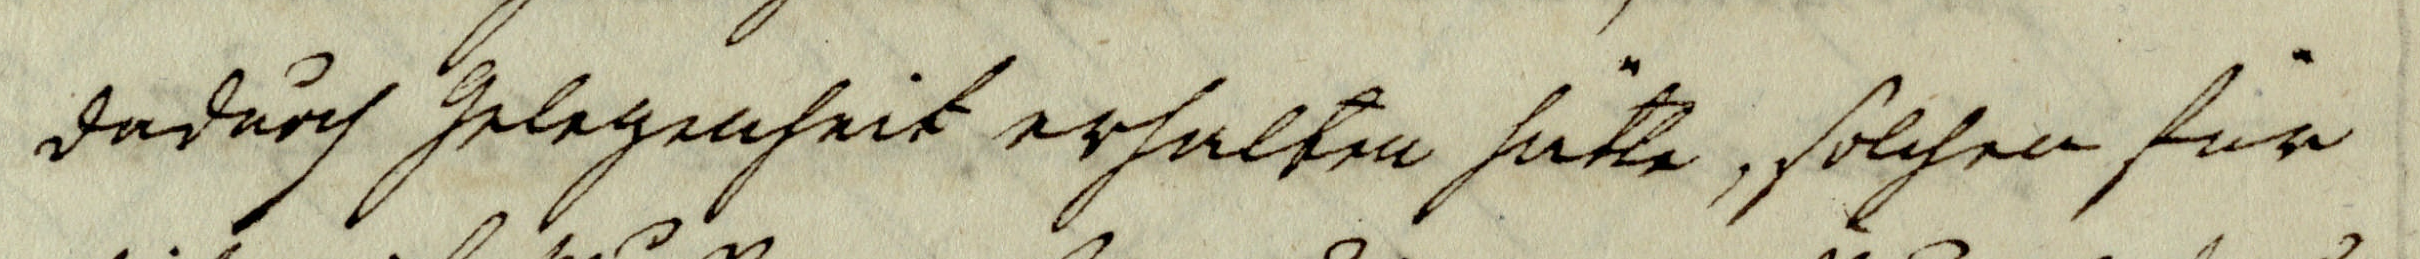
dadurch Gelegenheit erhalten hätte, solchen für
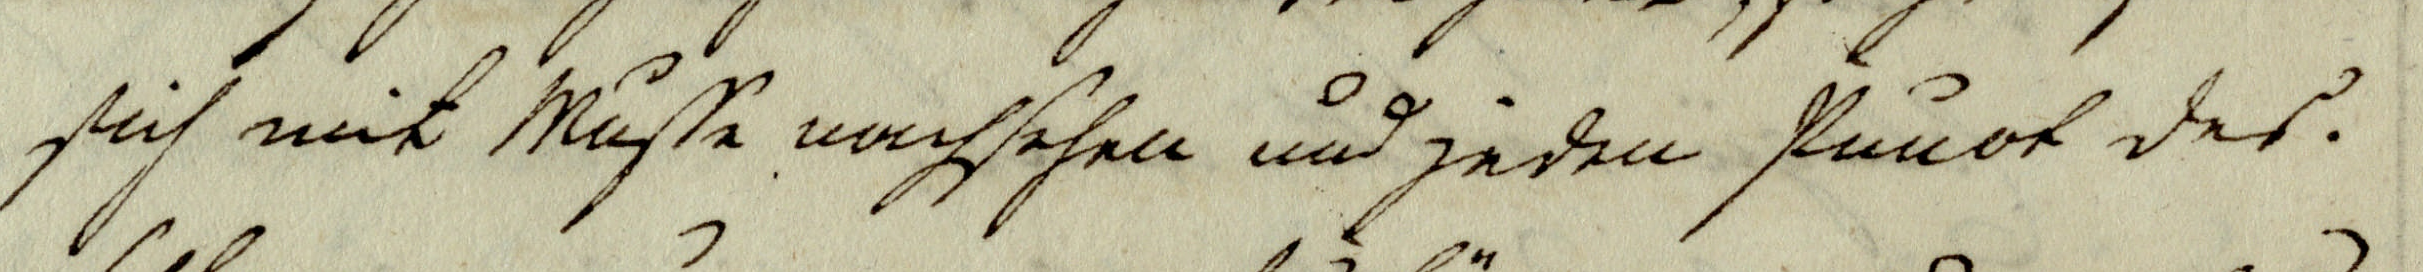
sich mit Musse nachsehen und jeden Punct des¬
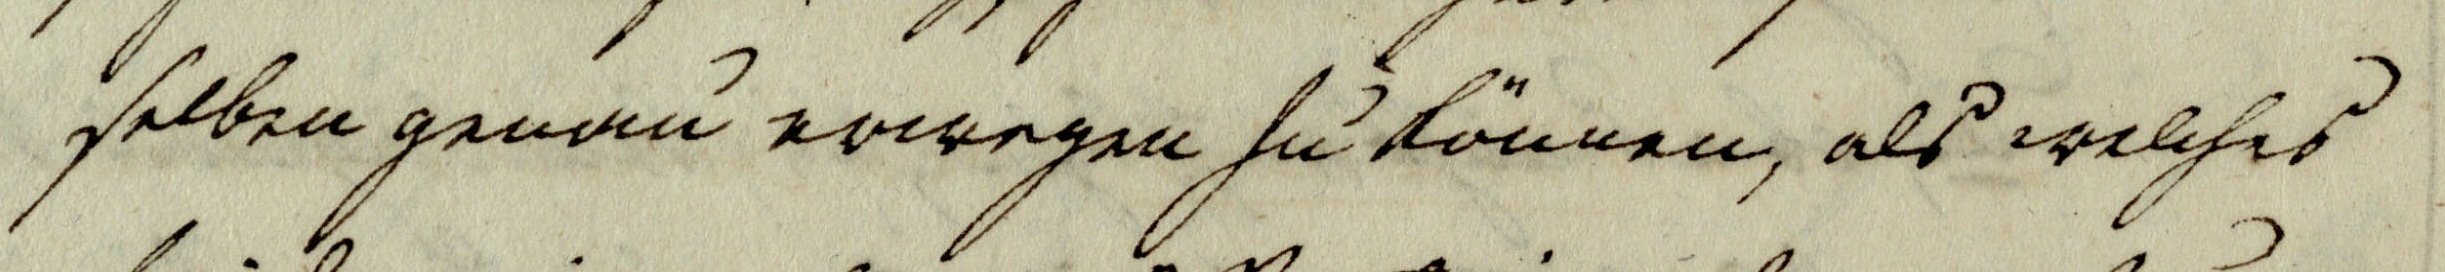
selben genau erwegen zu können, als welches
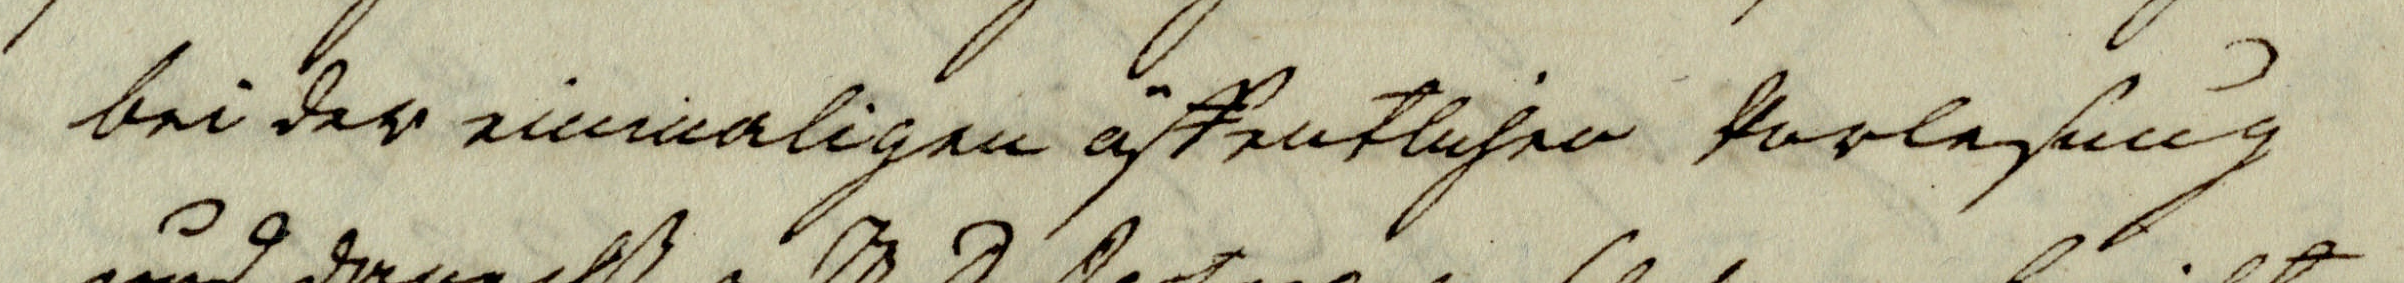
bei der einmaligen öffentlichen Vorlesung
